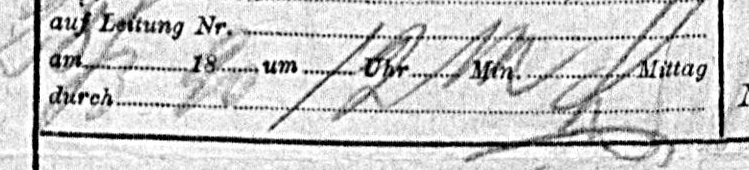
durch ...
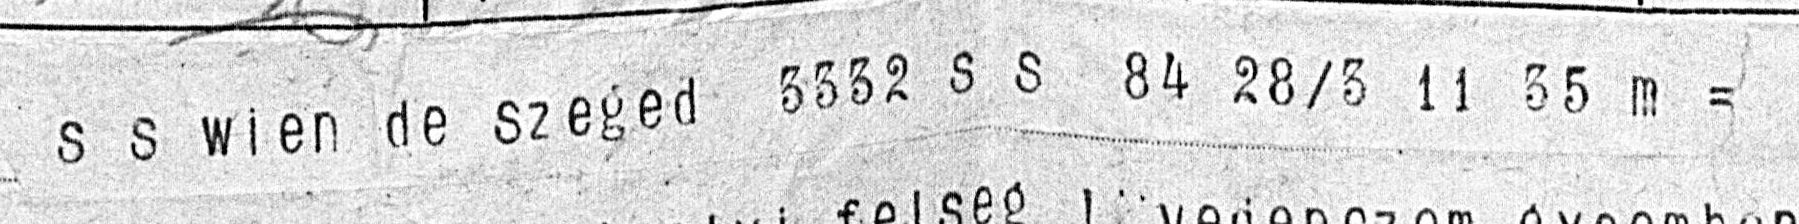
s s wien de szeged 3332 s s 84 28/3 11 35 m =
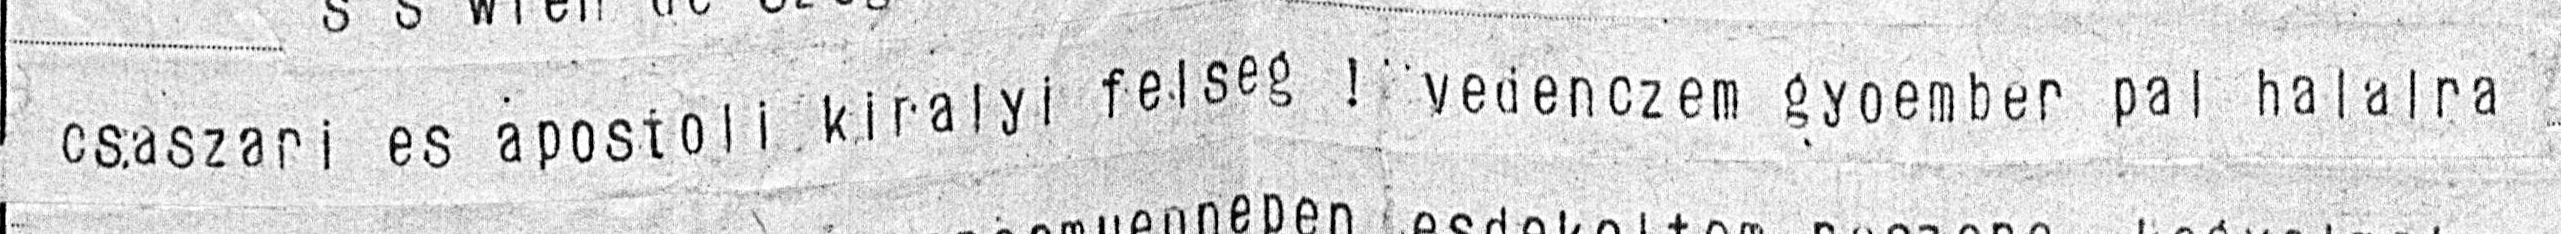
csaszari es apostoli kiralyi felseg ! vedenczem gyoember pal halalra
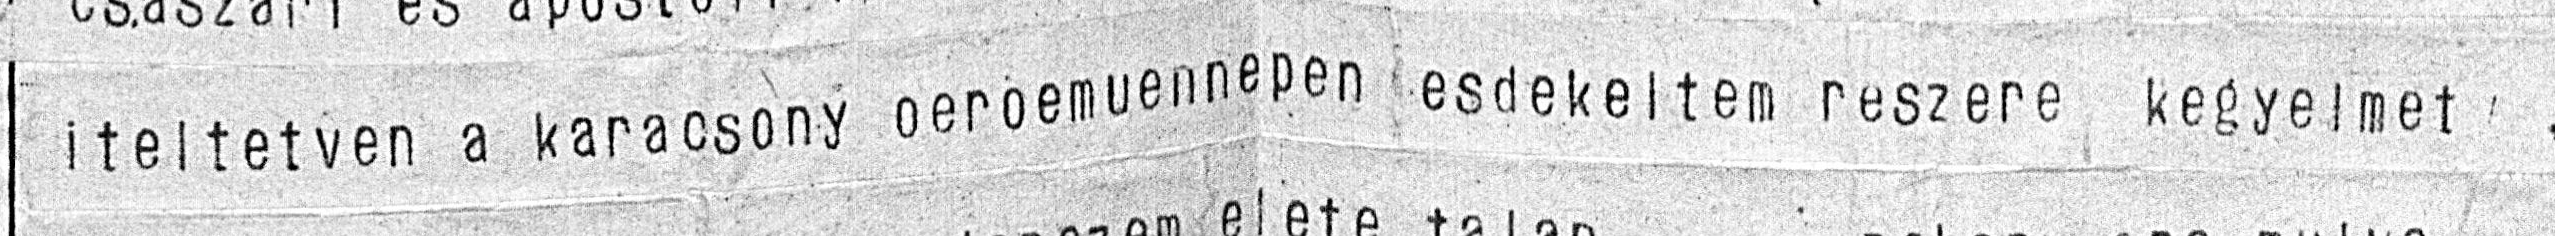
iteltetven a karacsony oeroemuennepen esdekeltem reszere kegyelmet
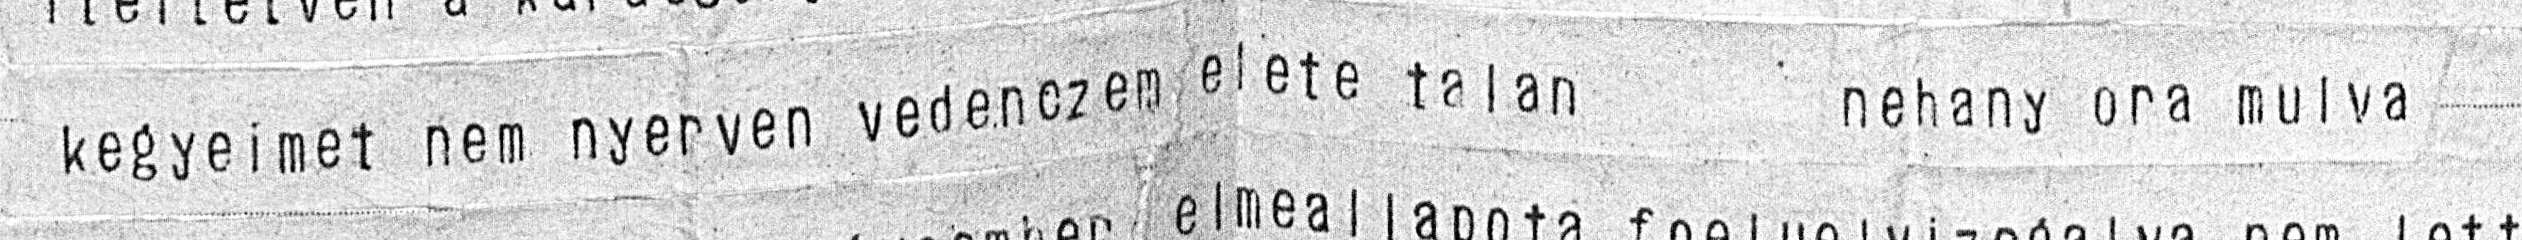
kegyeimet nem nyerven vedenczem elete talan nehany ora mulva
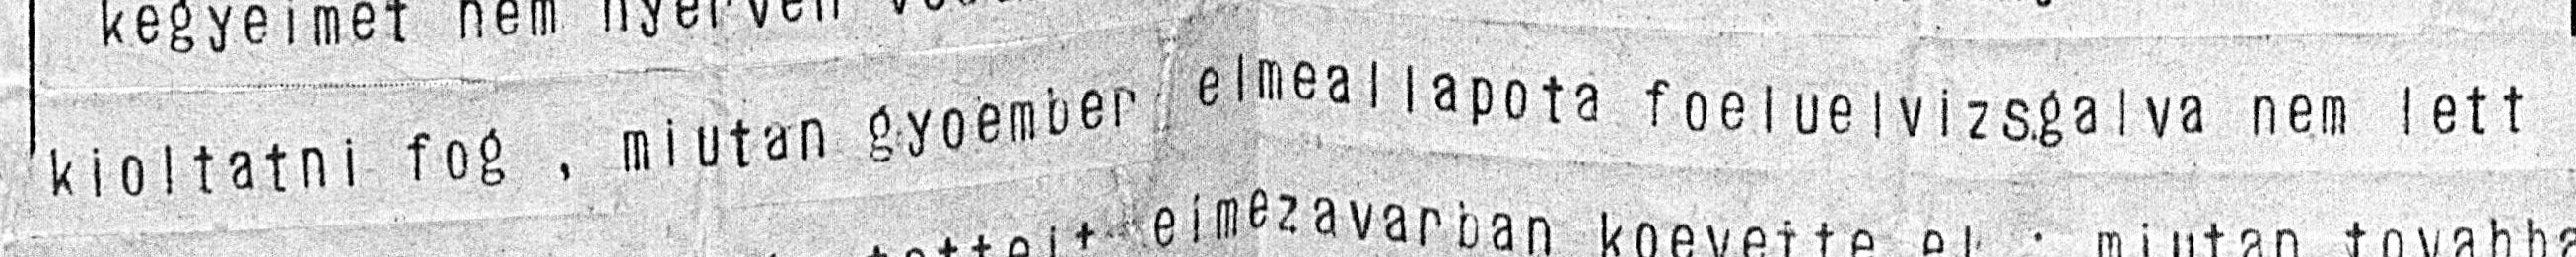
kioltatni fog, miutan gyoember elmeallapota foeluelvizsgalva nem lett
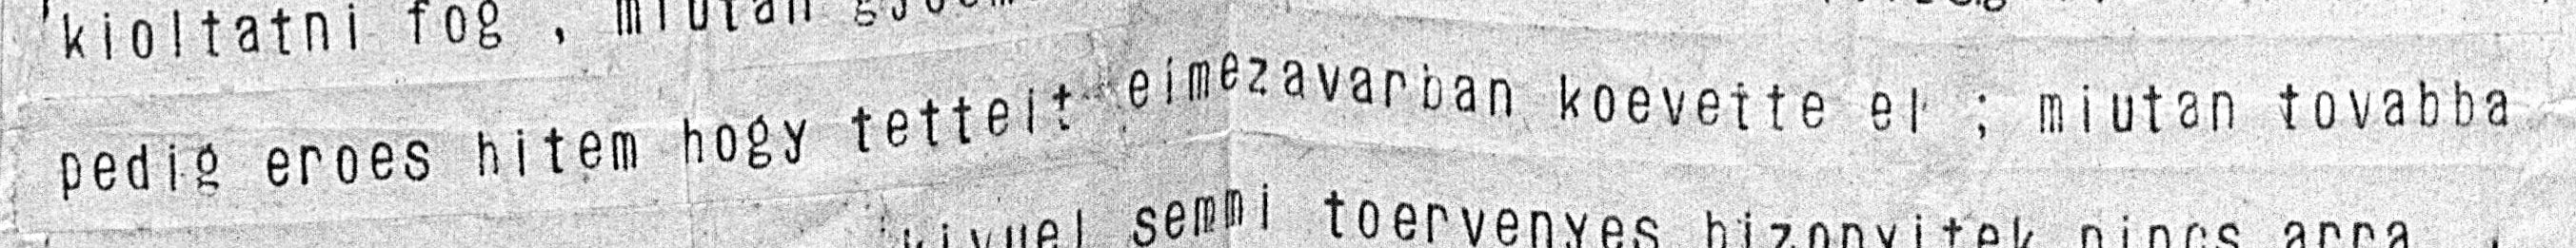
pedig eroes hitem hogy tetteit eimezavarban koevette el; miutan tovabba
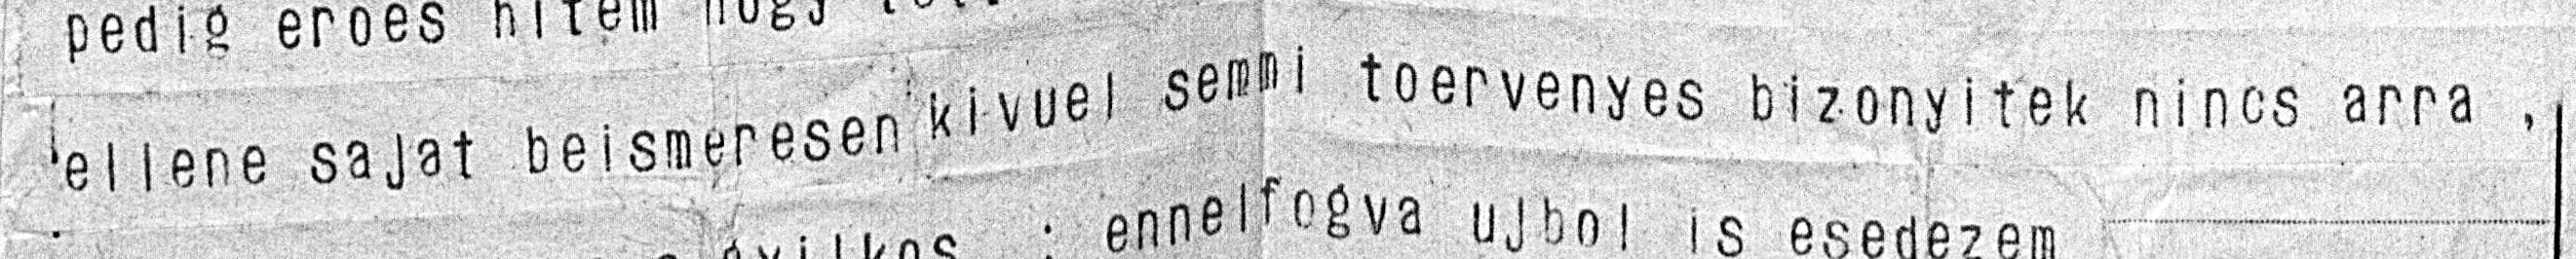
ellene sajat beismeresen kivuel semmi toervenyes bizonyitek nincs arra,
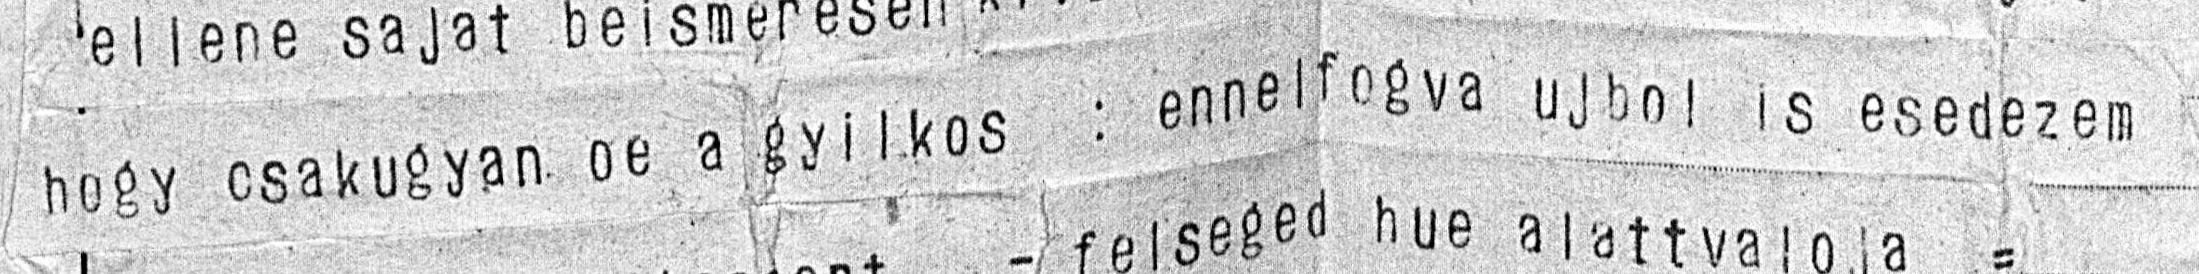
hogy csakygyan oe a gyilkos : ennelfogva ujbol is esedezem
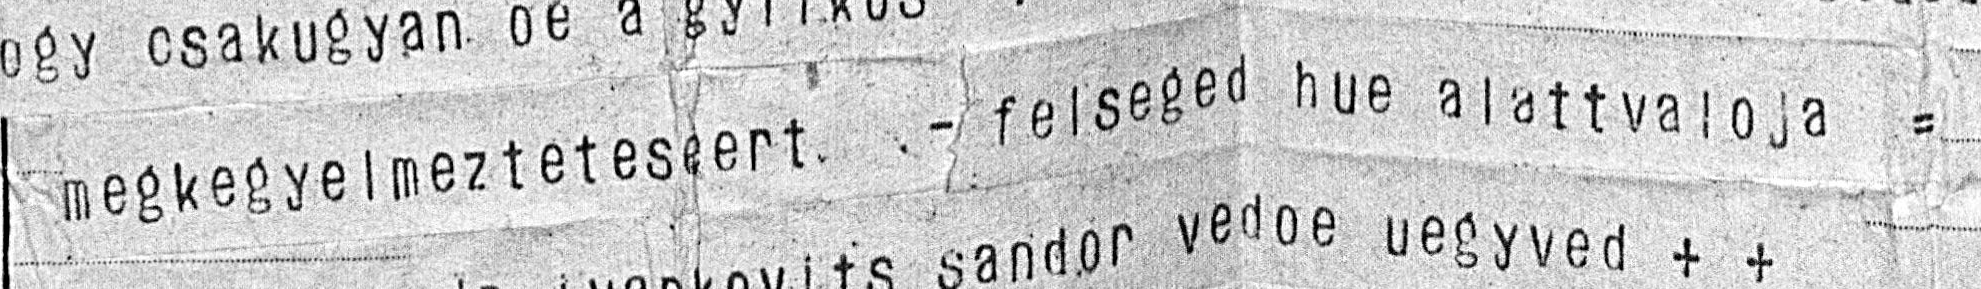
megkegyelmezteteseert.- felseged hue alattvaloja =
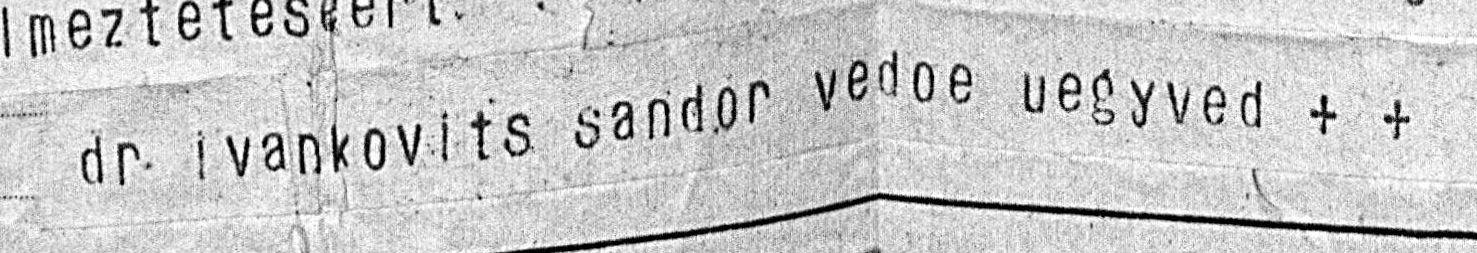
dr ivankovits sandor vedoe uegyved ++
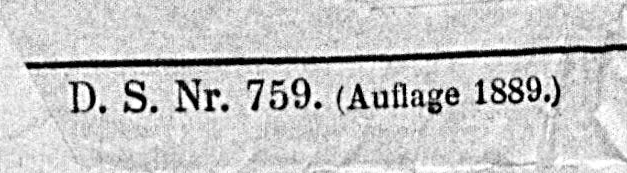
D.S.Nr. 759. (Auflage 1889.)
